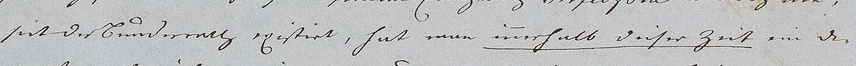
seit der Bundesrath existirt, hat man innerhalb dieser Zeit ein De-
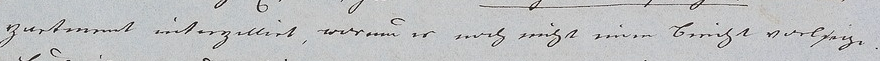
partement interpellirt, warum es noch nicht einen Bericht vorlege. –
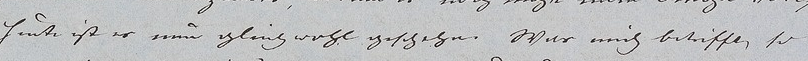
Heute ist es nun gleich wohl geschehn. Was mich betrifft, so
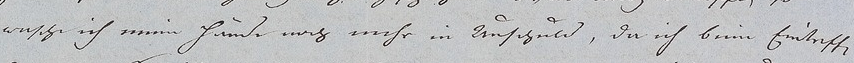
wasche ich meine Hände noch mehr in Unschuld, da ich beim Eintreffen
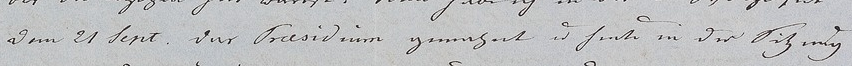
dem 21 Sept. das Præsidium gemahnt u heute in der Sitzung
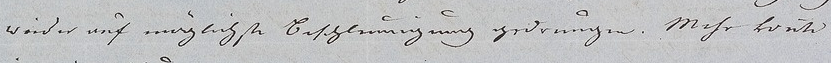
wieder auf möglichste Beschleunigung gedrungen. Mehr konnte
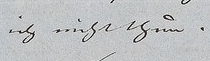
ich nicht thun.
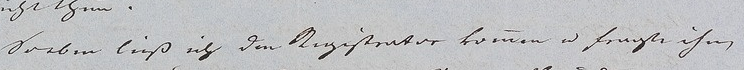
Soeben ließ ich den Registrator kommen u fragte ihn,
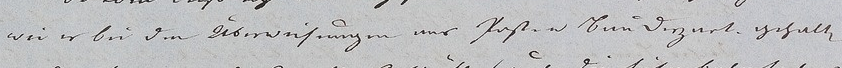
wie es bei den Überweisungen ans Post- u BauDepart. gehalten
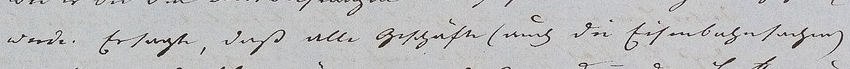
werde. Er sagte, dass alle Geschäfte (auch die Eisenbahnsachen)
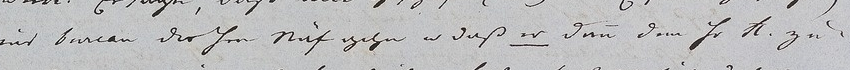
ins bureau des Hrn Näf gehn u daß er dann dem Hr St. zu-
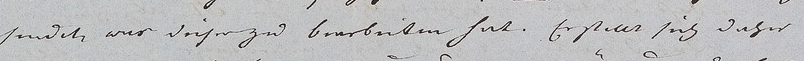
sendet, was dieser zu bearbeiten hat. Es stellt sich daher
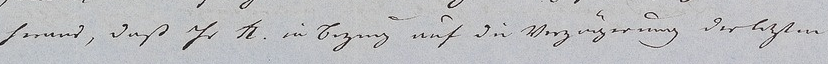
heraus, daß Hr. St. in Bezug auf die Verzögerung der letzten
